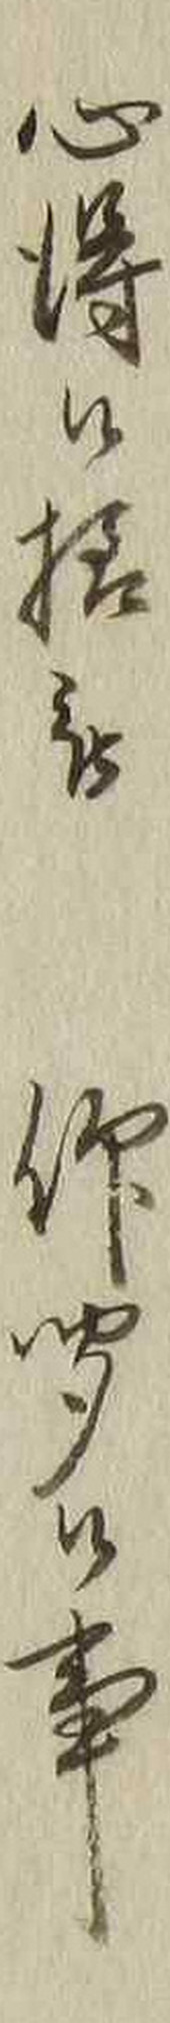心得候様被仰聞候事
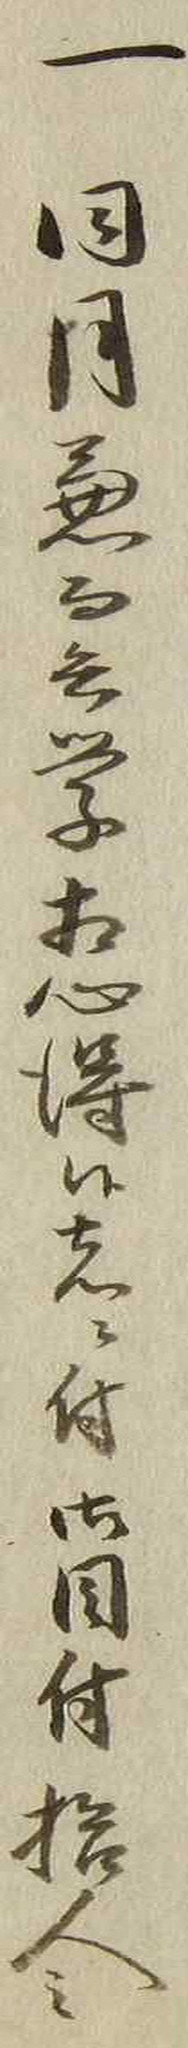一同月兼而兵学相心得候者に付御目付拾人之
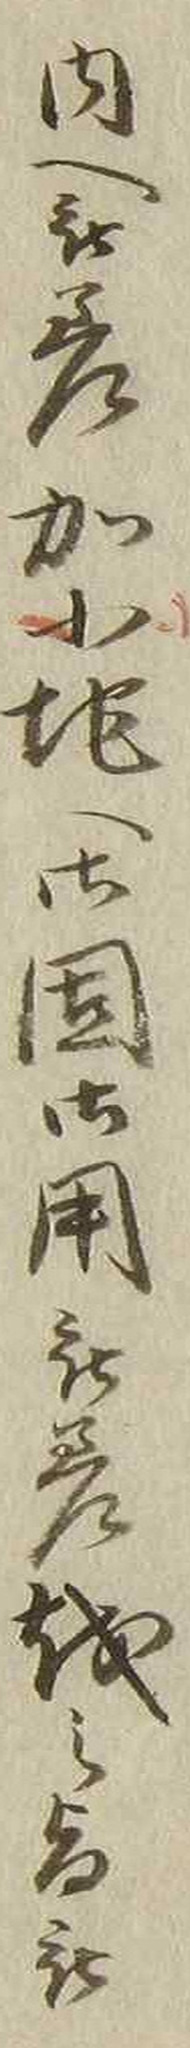内へ被差加北地へ御固御用被差越之旨被
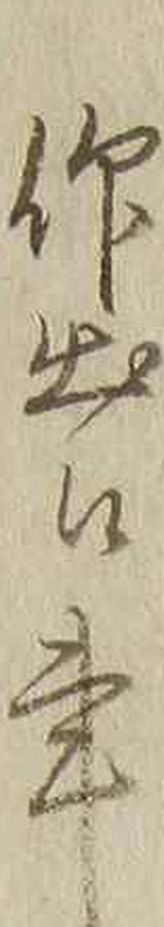仰出候事
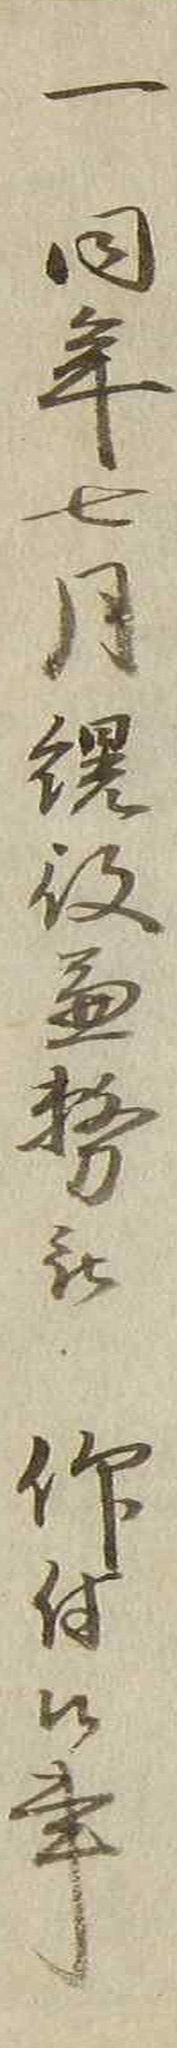一同年七月縨役兼務被仰付候事
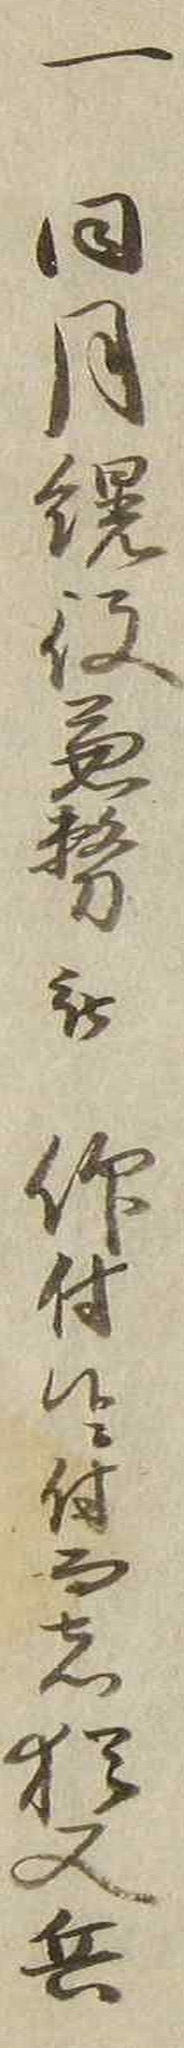一同月縨役兼務被仰付候に付而は猶又兵

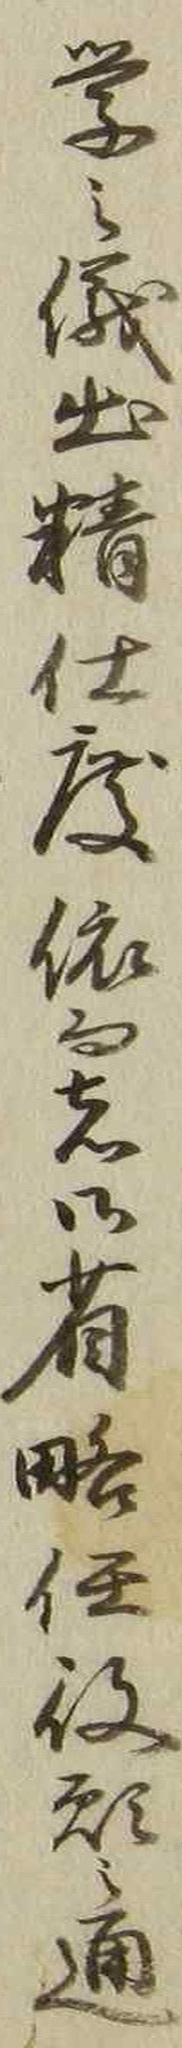学之儀出精仕度依而は御省略任役願之通
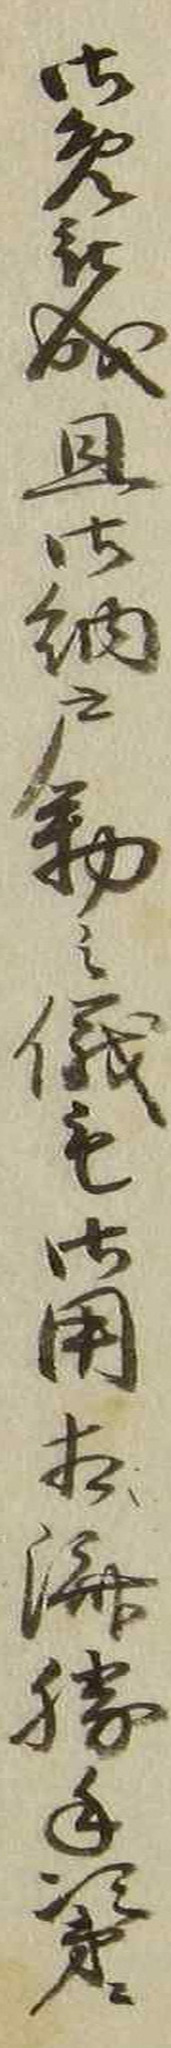御免被成且御納戸勤之儀も御用相済勝手次第に
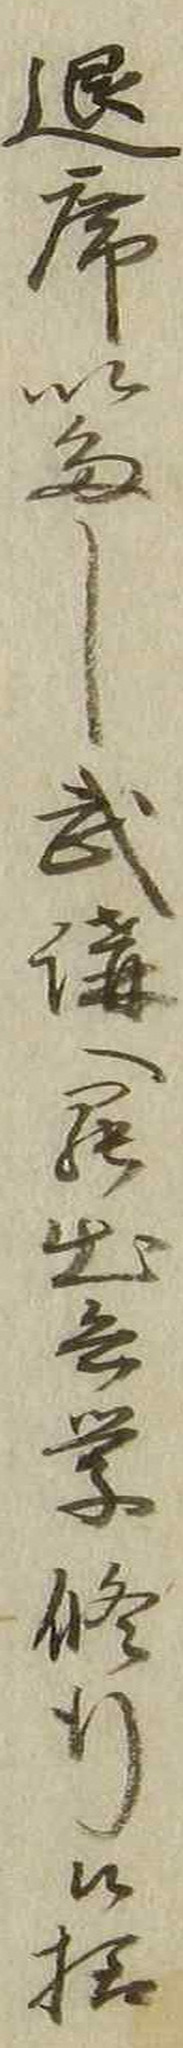退席いたし武講へ罷出兵学修行候様
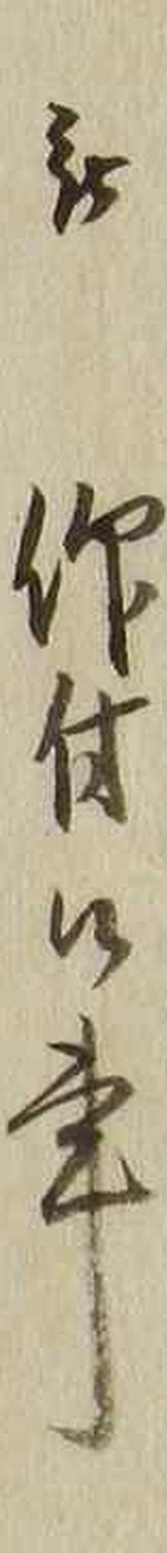被仰付候事
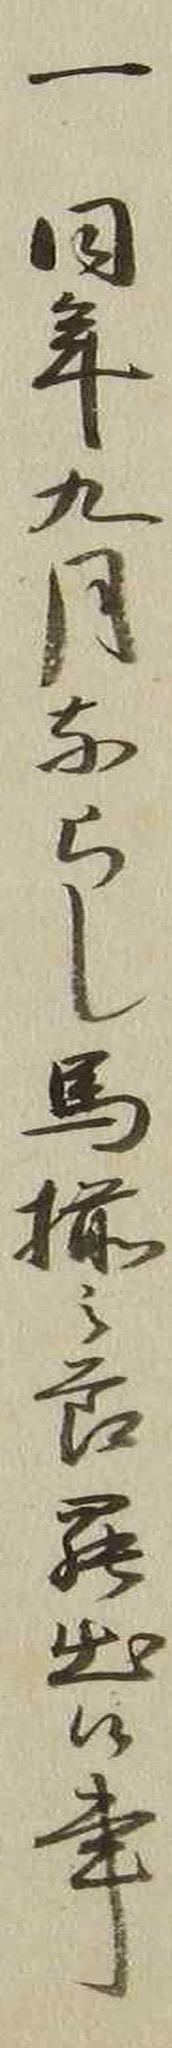一同年九月ならし馬揃之節罷出候事
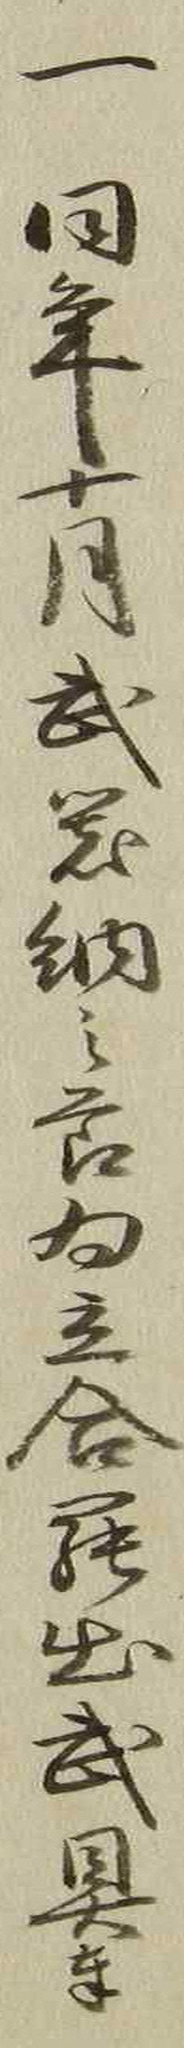一同年十月武器納之節為立合罷出武具奉
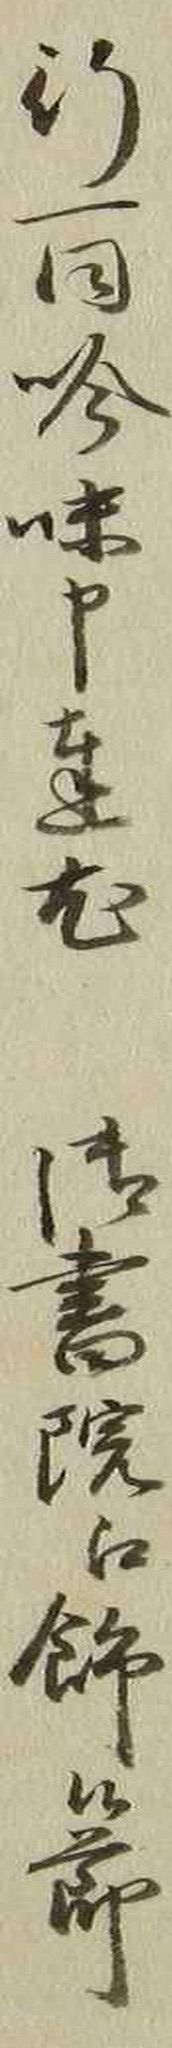行一同吟味申達尤御書院江飾候節
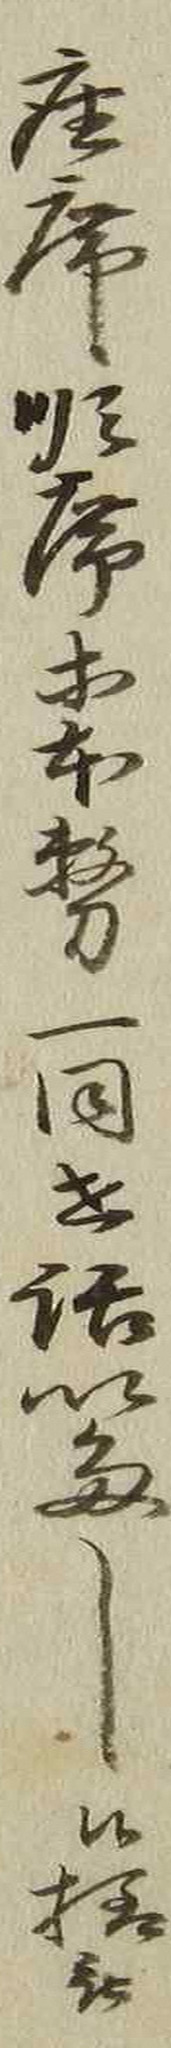座席順席等本務一同世話いたし候様
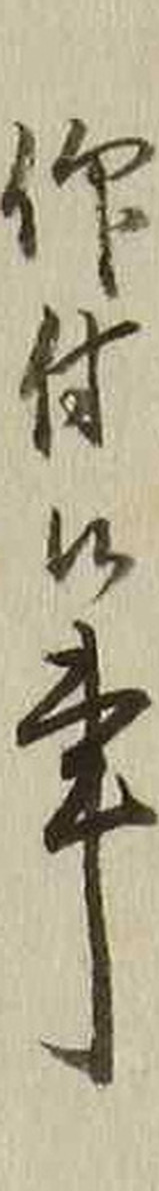仰付候事
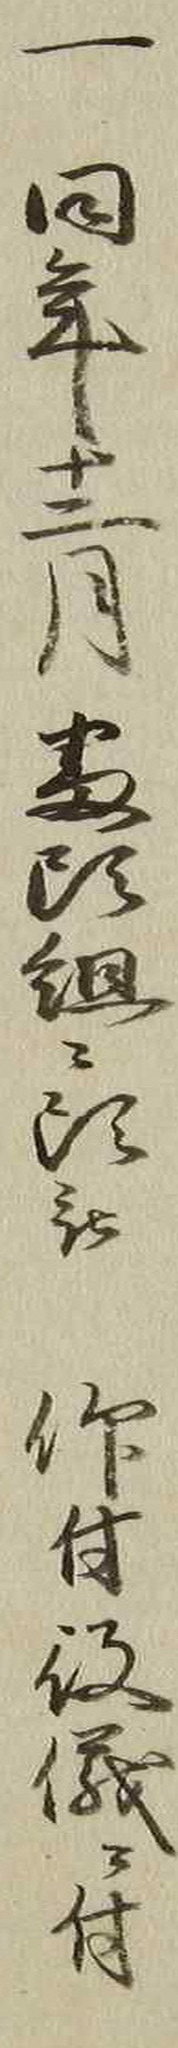一同年十三月番頭組に頭被仰付役儀に付
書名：諸士系譜　巻之133　た之部9
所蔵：会津若松市立会津図書館
